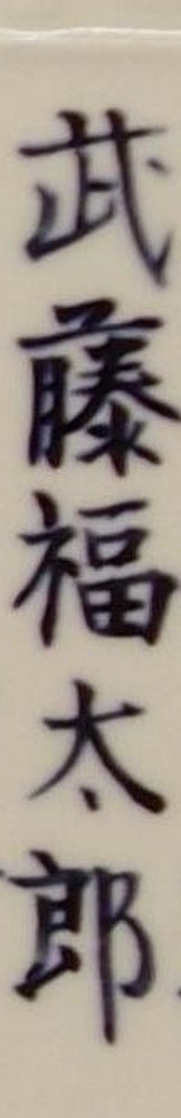武藤福太郎
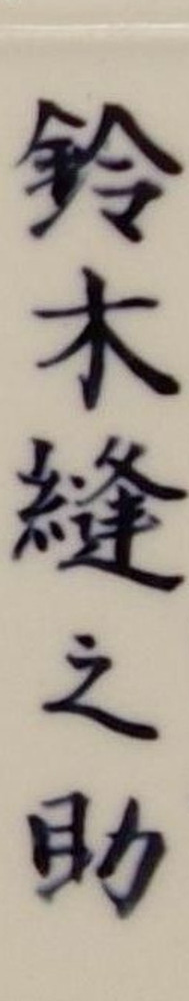鈴木縫之助
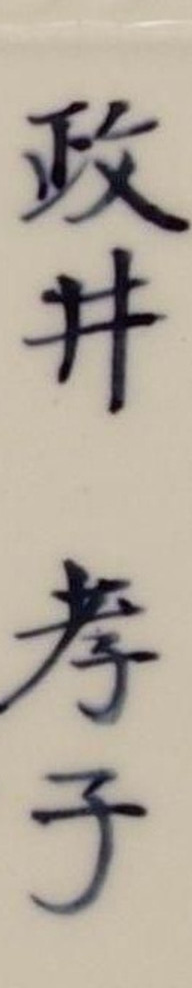政井孝子
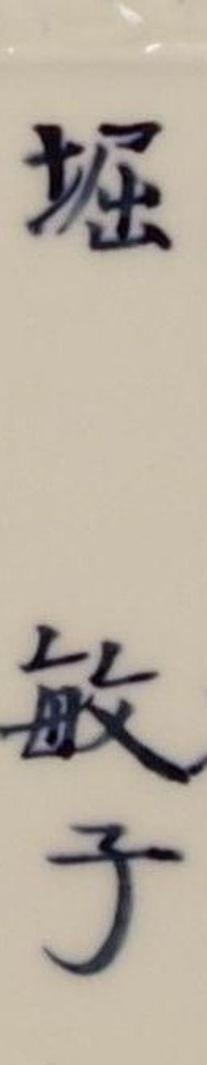堀敏子
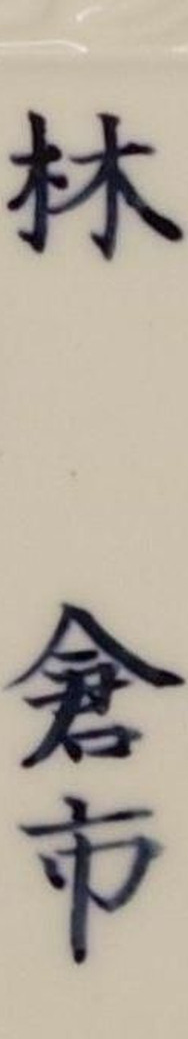林倉市
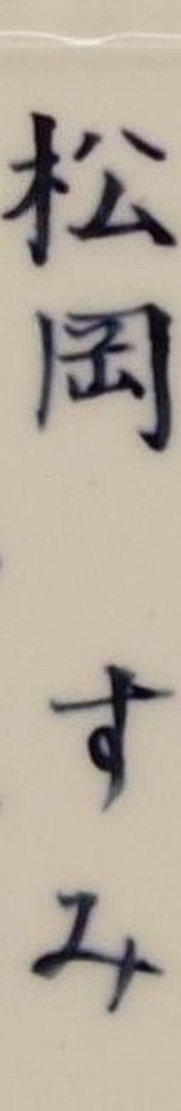松岡すみ
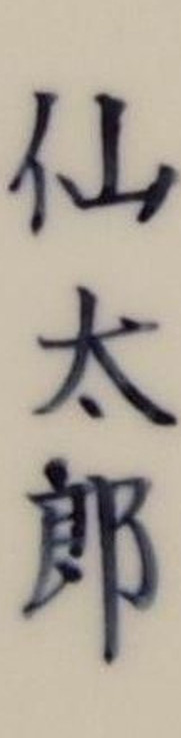仙太郎
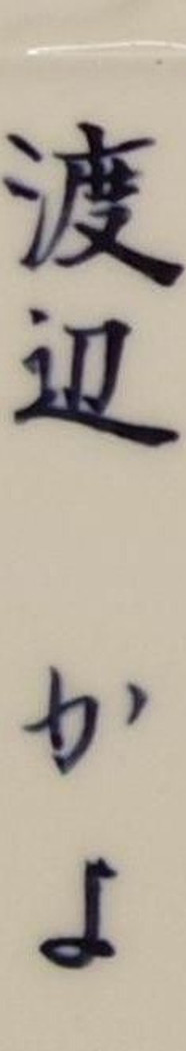渡辺かよ
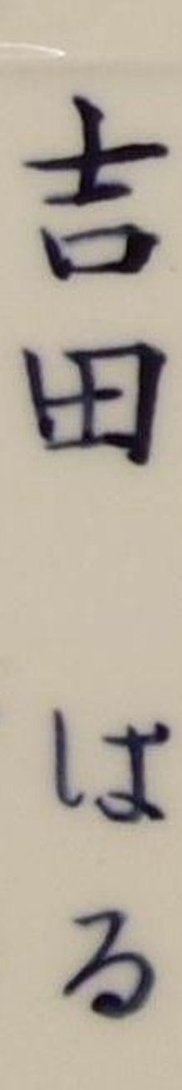吉田はる
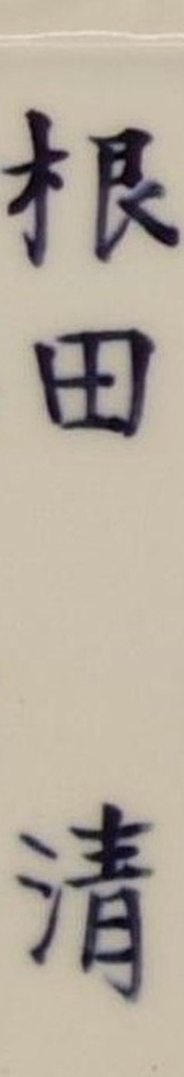根田清
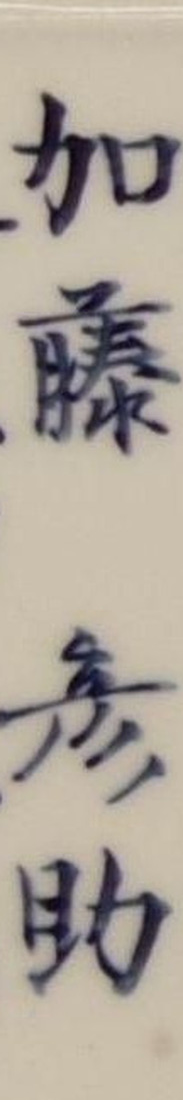加藤彦助
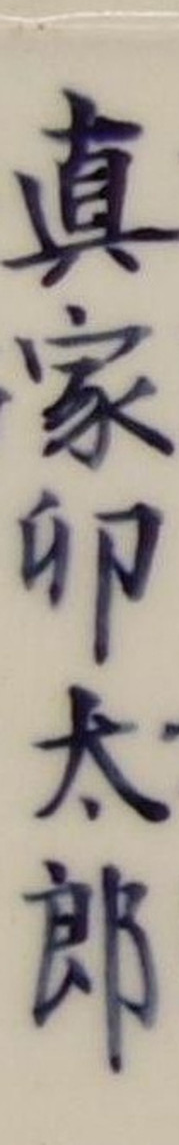真家卯太郎
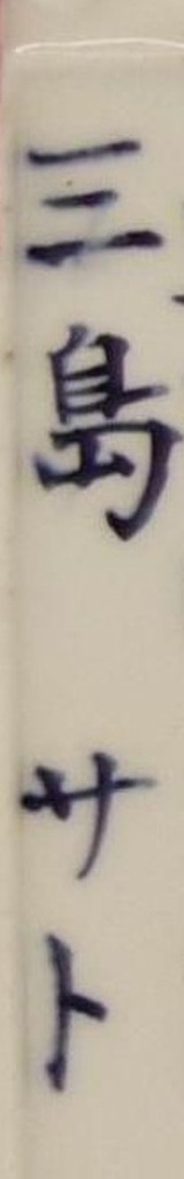三島サト

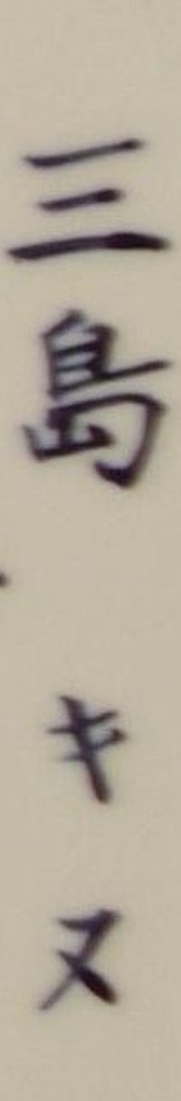三島キヌ
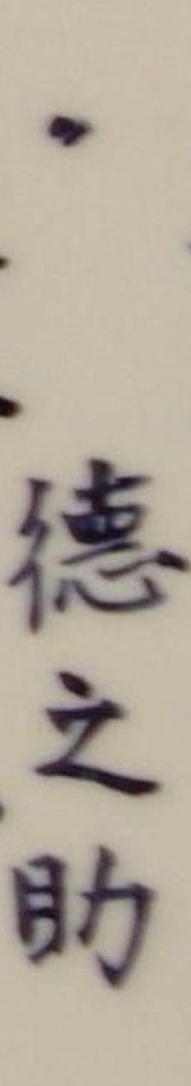徳之助
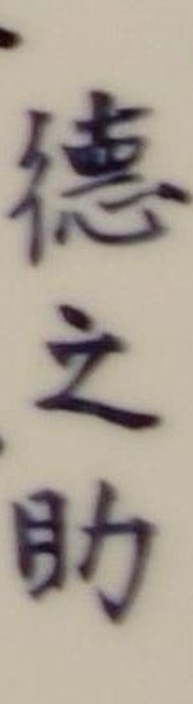徳之助
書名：E~L
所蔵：高野山金剛峯寺
